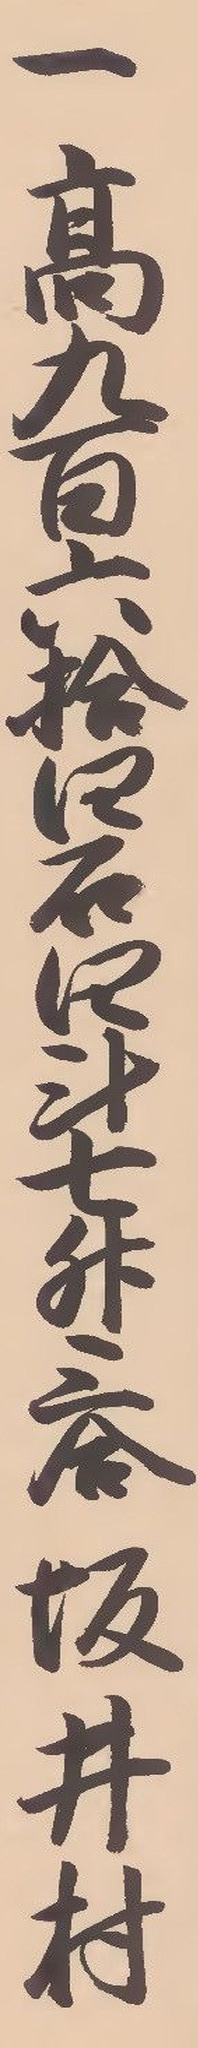一高九百六拾四石四斗七升三合坂井村
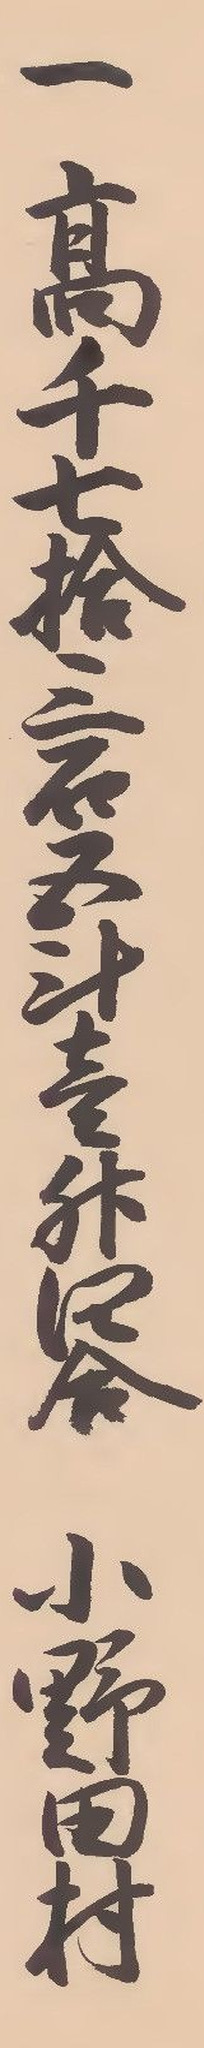一高千七拾三石五斗壱升四合小野田村
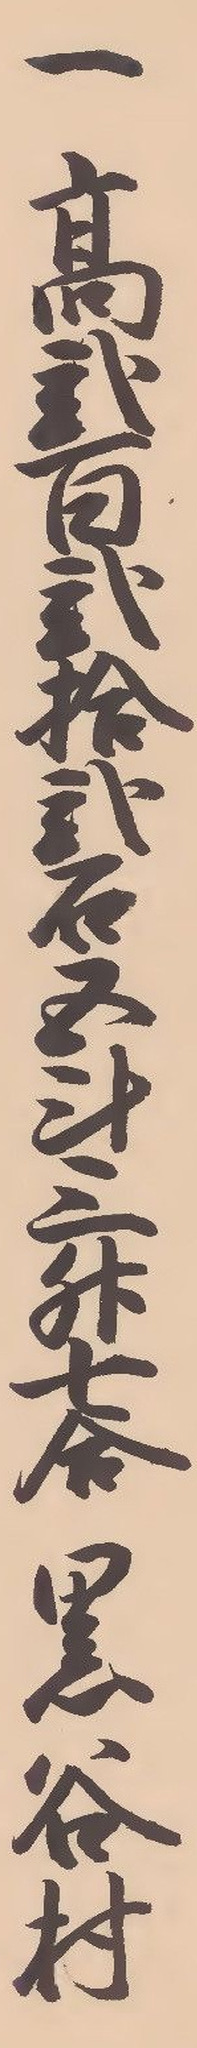一高弐百弐拾弐石五斗三升七合黒谷村
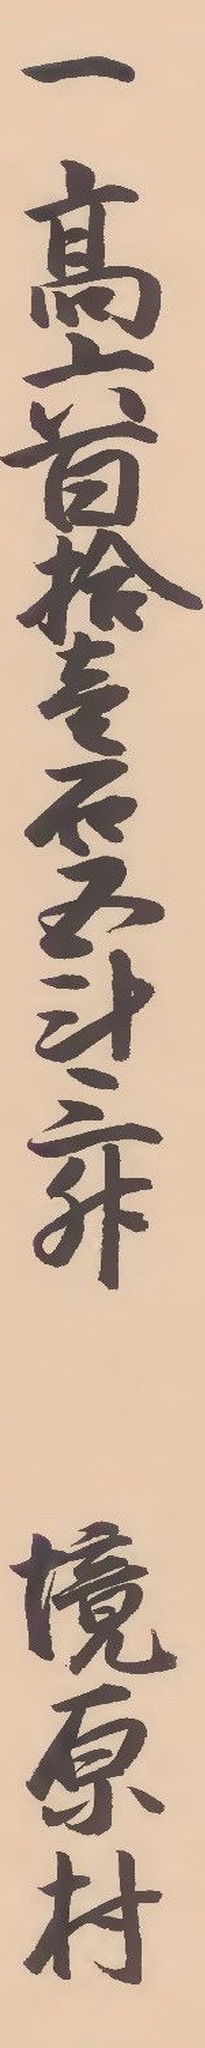一高六拾壱石五斗三升境原村

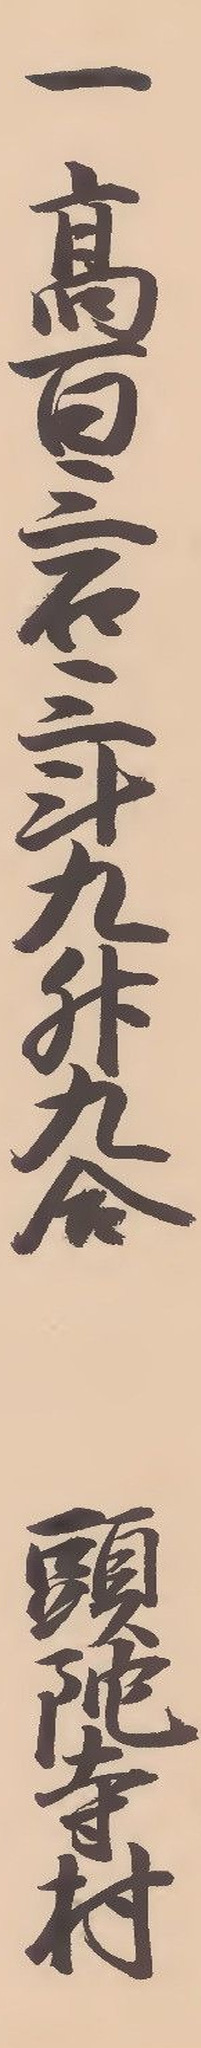一高百三石三斗九升九合頭陀寺村
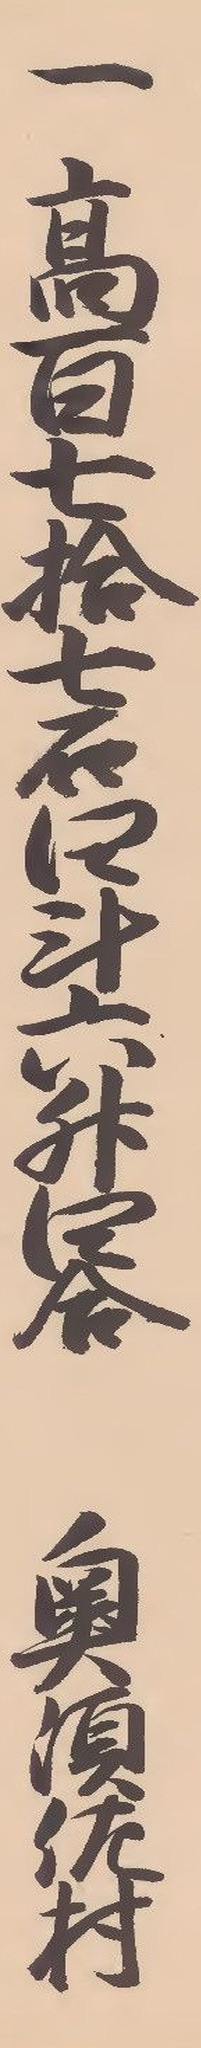一高百七拾七石四斗六升四合奥須佐村
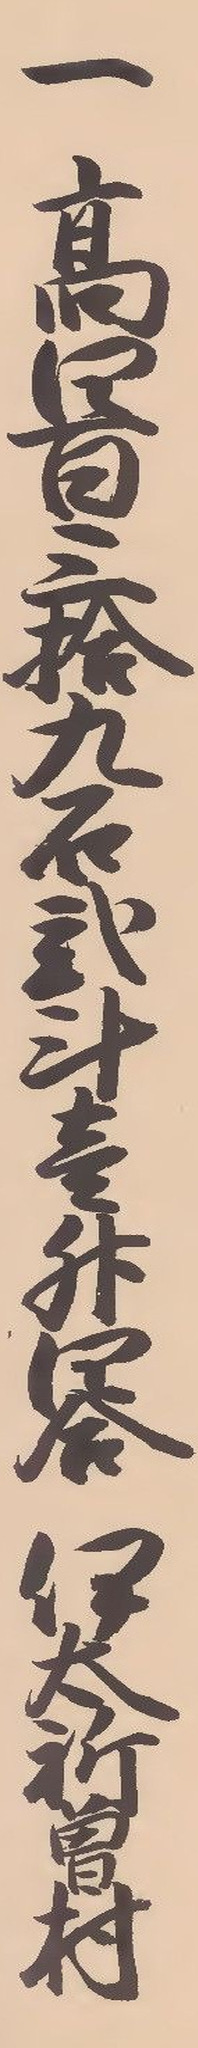一高四百三拾九石弐斗壱升四合伊太祈曽村
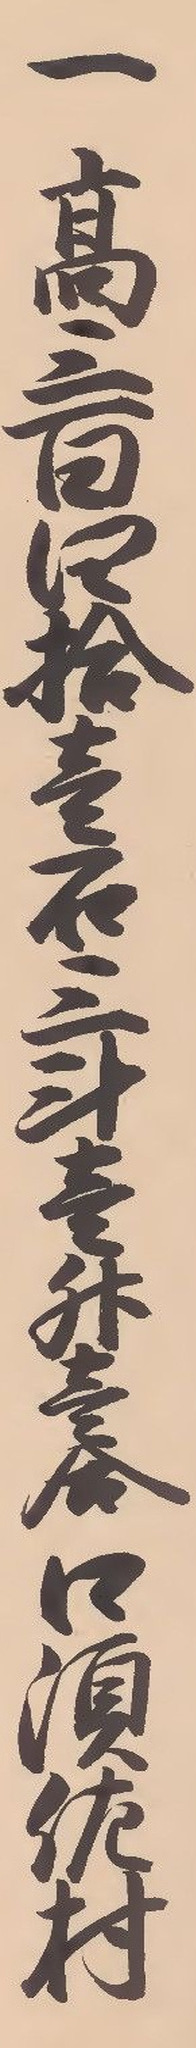一高三百四拾壱石三斗壱升壱合口須佐村
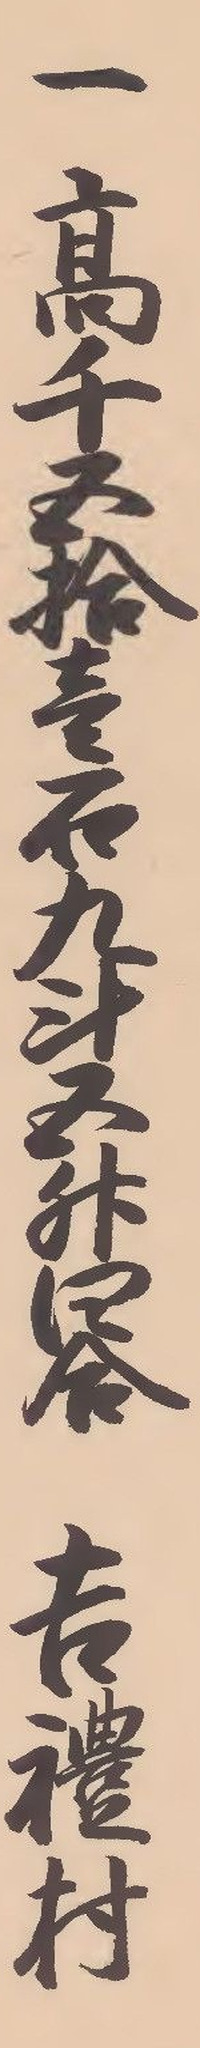一高千五拾壱石九斗五升四合吉礼村

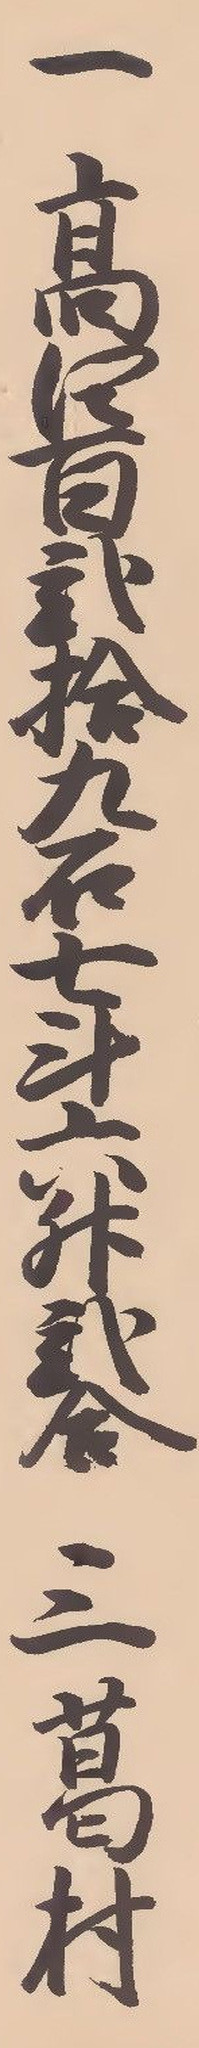一高四百弐拾九石七斗六升弐合三葛村
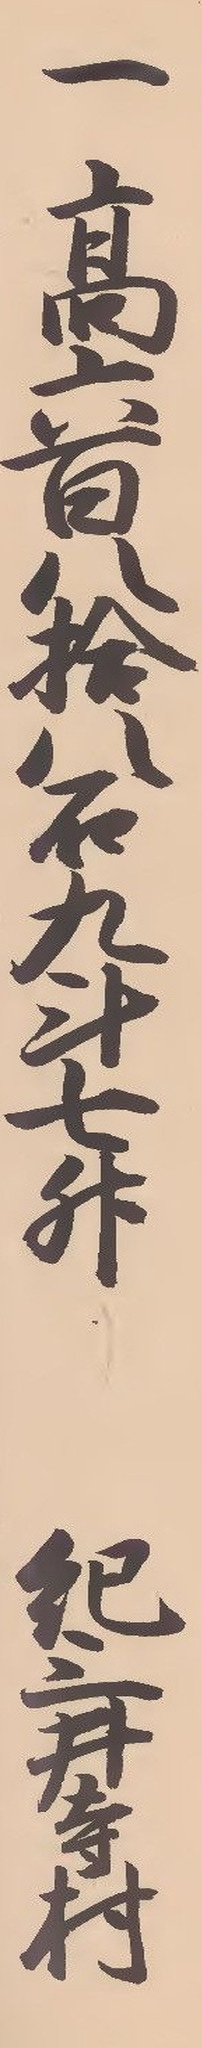一高六百八拾八石九斗七升紀三井寺村
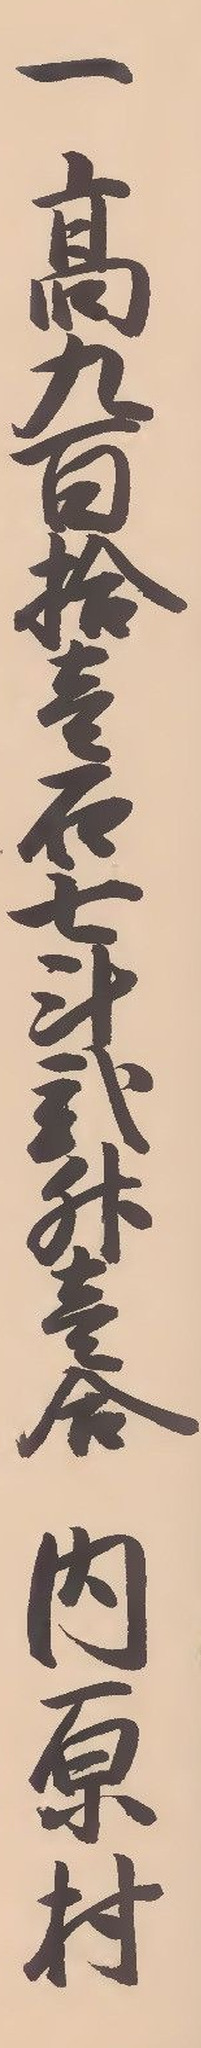一高九百拾壱石七斗弐升壱合内原村
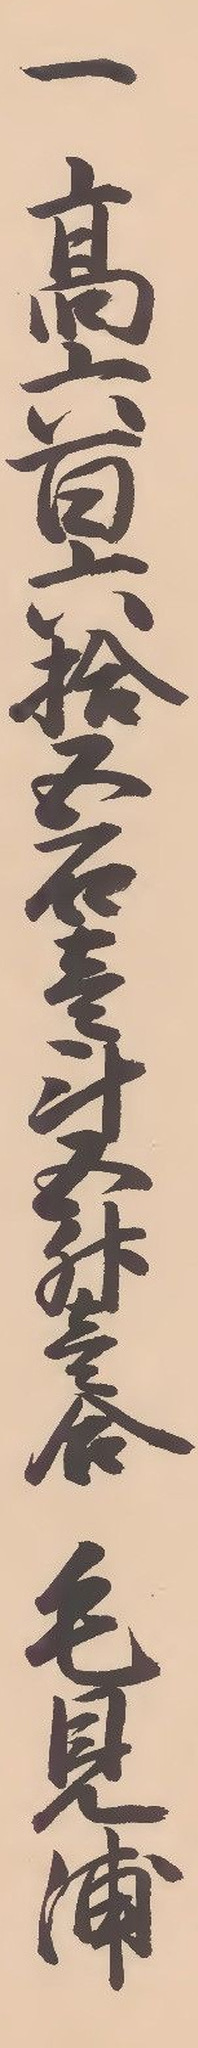一高六百六拾五石壱斗五升壱合毛見浦
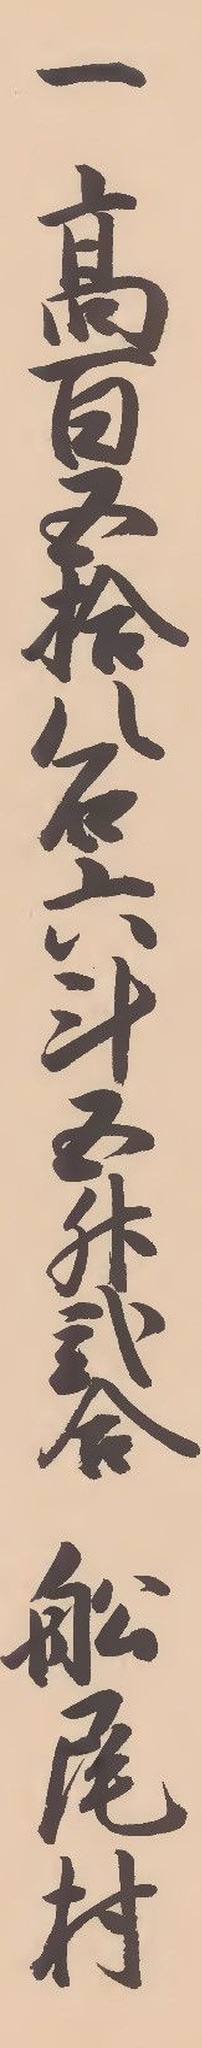一高百五拾八石六斗五升弐合船尾村
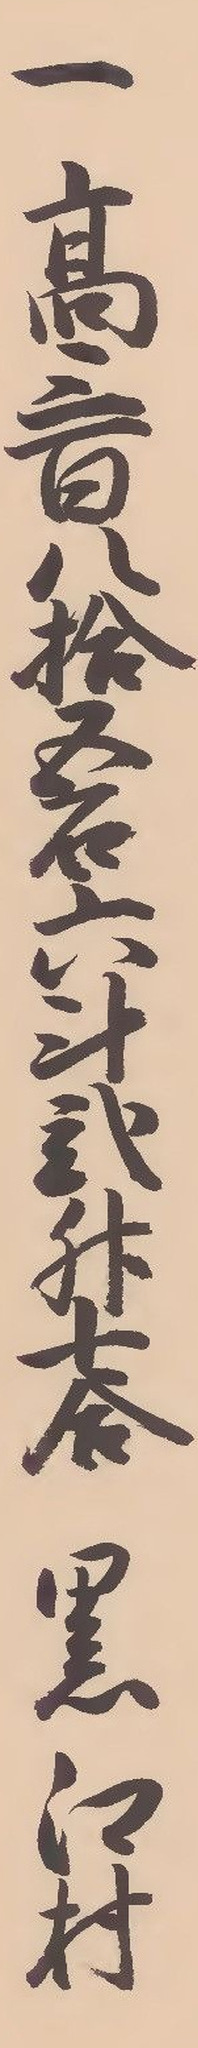一高三百八拾五石六斗弐升七合黒江村

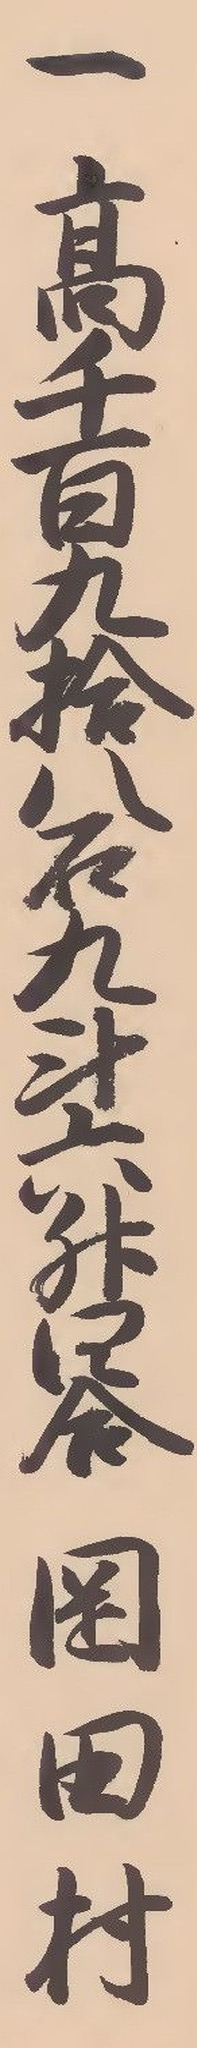一高千百九拾八石九斗六升四合岡田村
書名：紀伊国郷帳
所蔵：国立公文書館 National Archives of Japan
